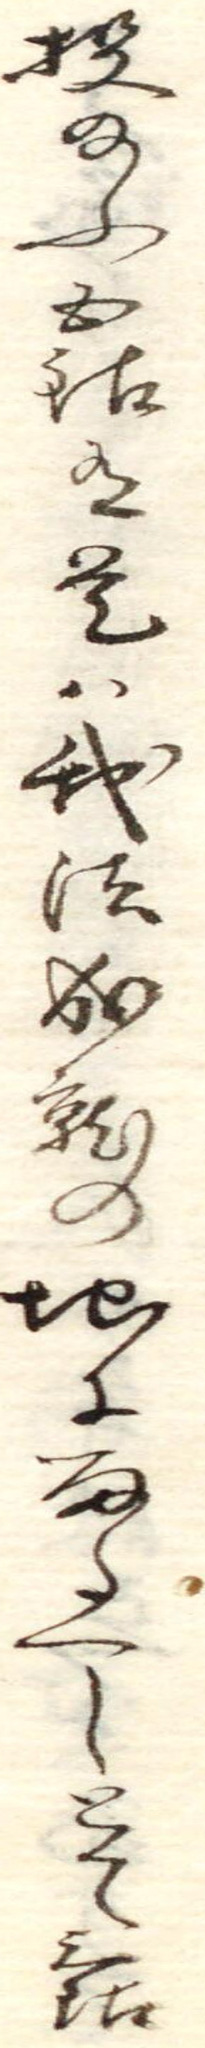投給ふ御鈷有是は我法成就の地に留るへしとて三鈷
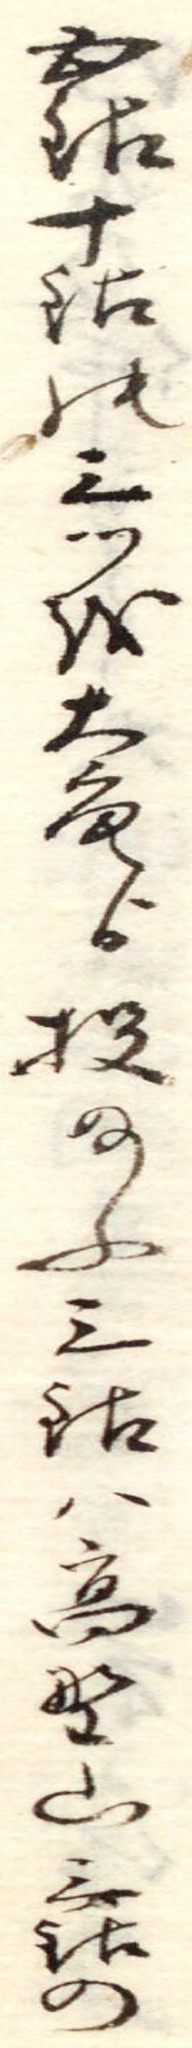五鈷十鈷の三ッを大唐ゟ投給ふ三鈷は高野山三鈷の
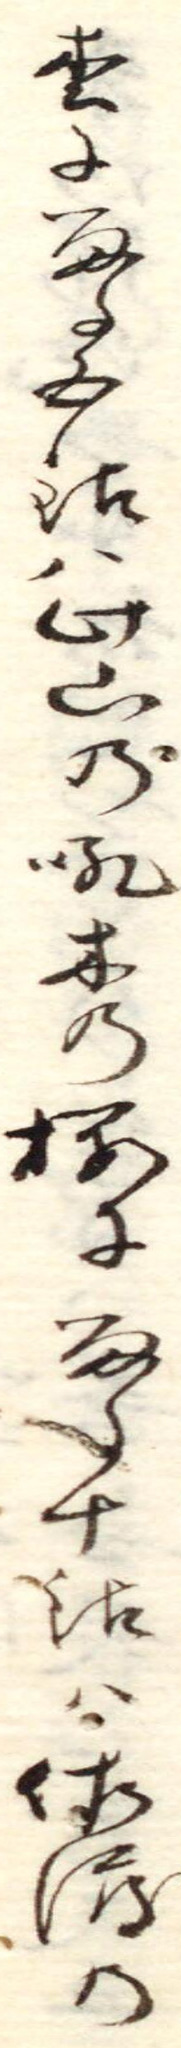杢に留る五鈷は此山の吼木の桜に留る十鈷は佐渡の
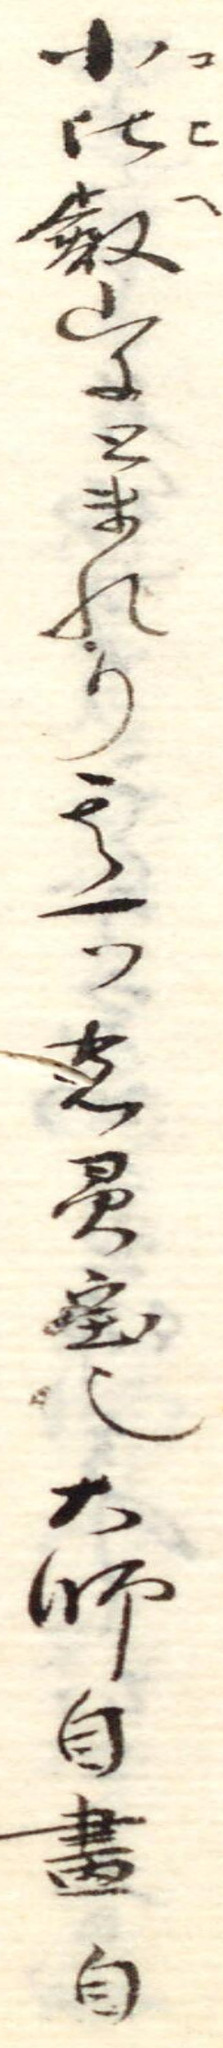小比叡山にとまれり其一つの霊宝也大師自書自
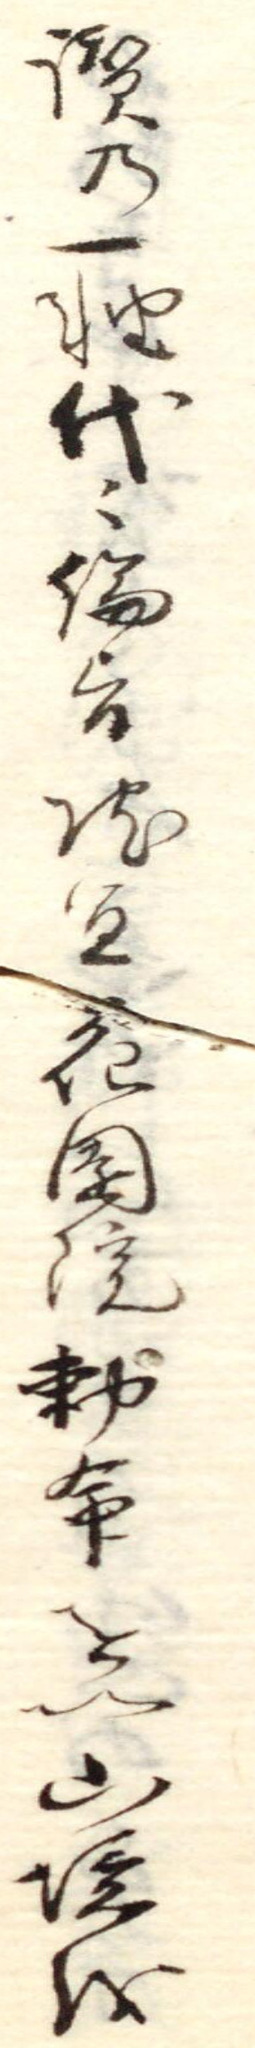讃の一軸代々綸旨院宣花園院勅命を以山境を
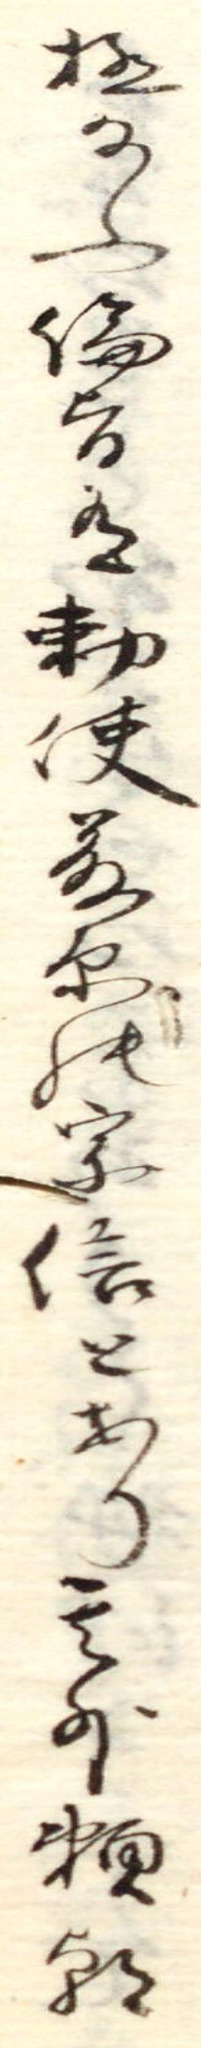極給ふ綸旨有勅使藤原の宗信とあり其外頼朝
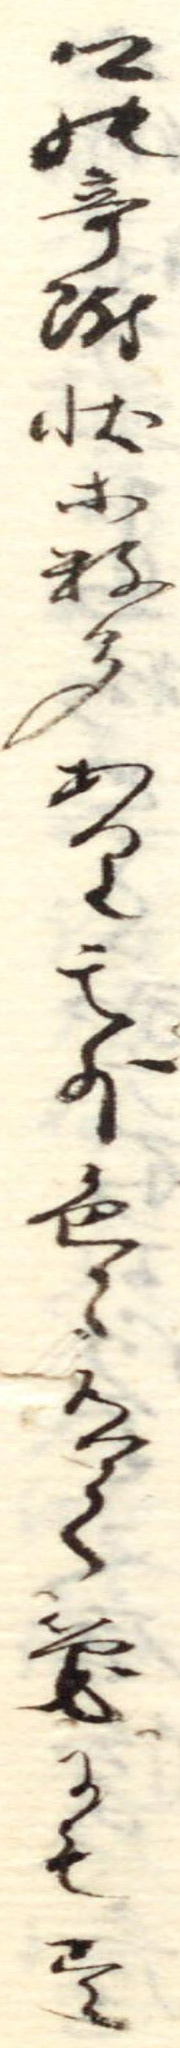卿の奇附状等数多あり其外色々有之筆にて尽
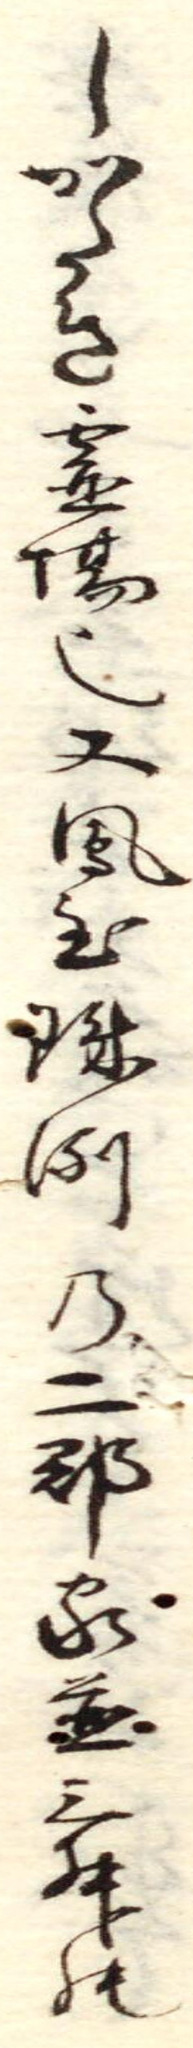しかたき霊場也又鳳至珠洲の二郡家並三升の
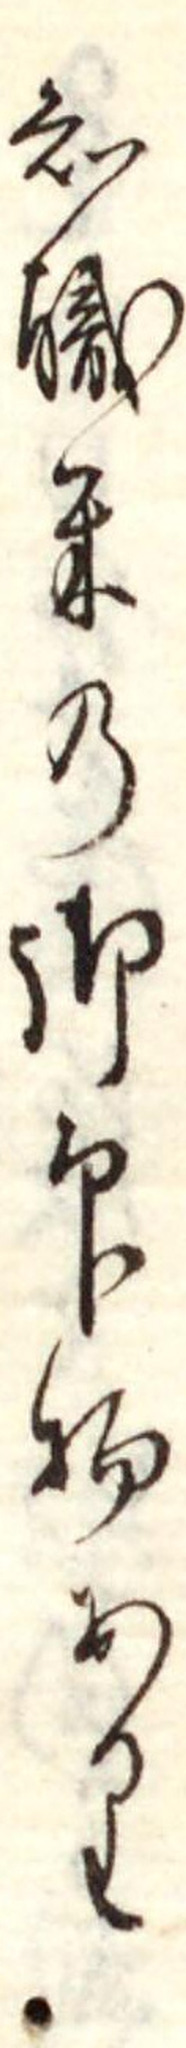知識米の御印物あり
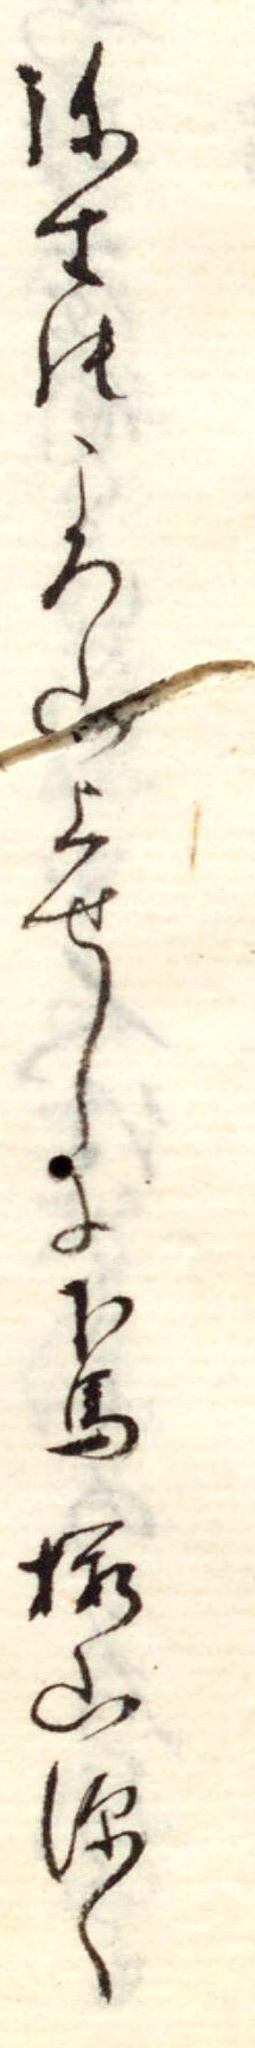弥生のころ山上せしに下馬桜山深く
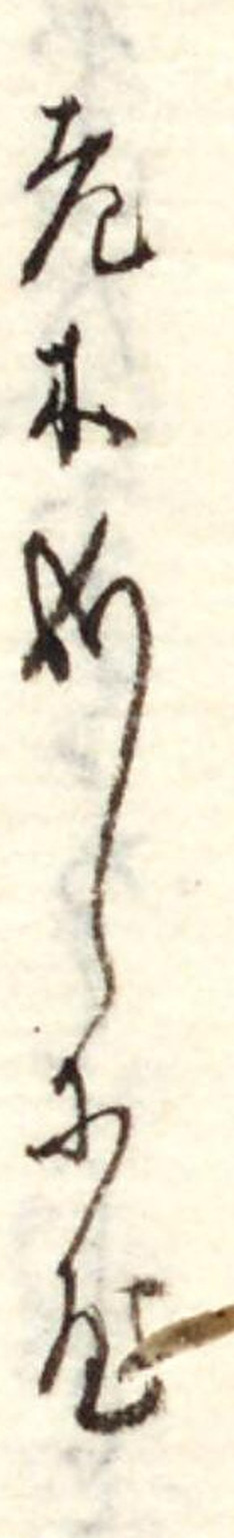老木成しにや
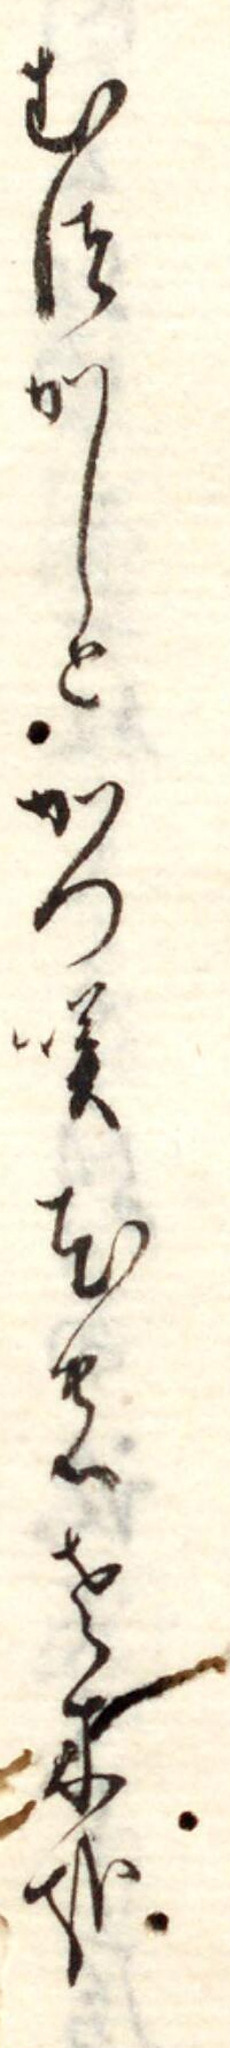むつかしとかつ咲花のさき哉
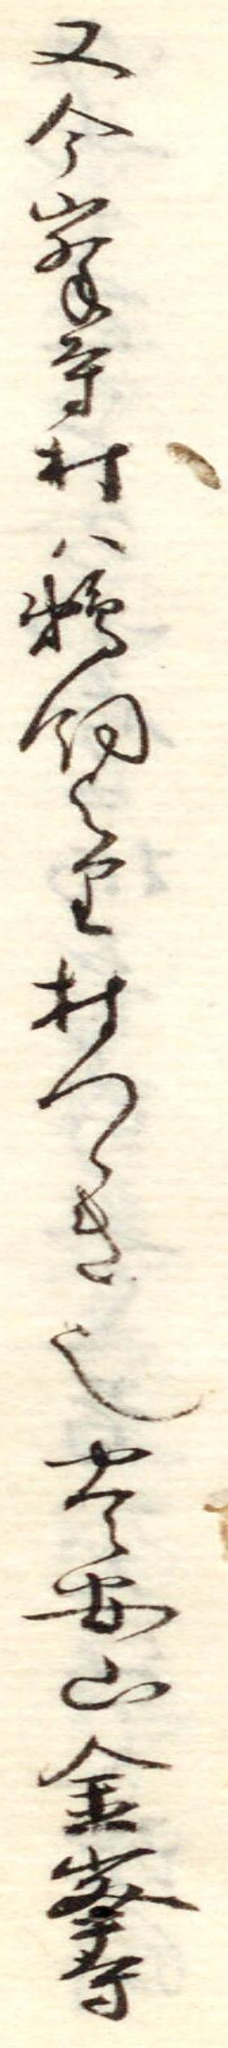又今峰寺村は鵜飼之里村つゝき也豊安山金峰寺
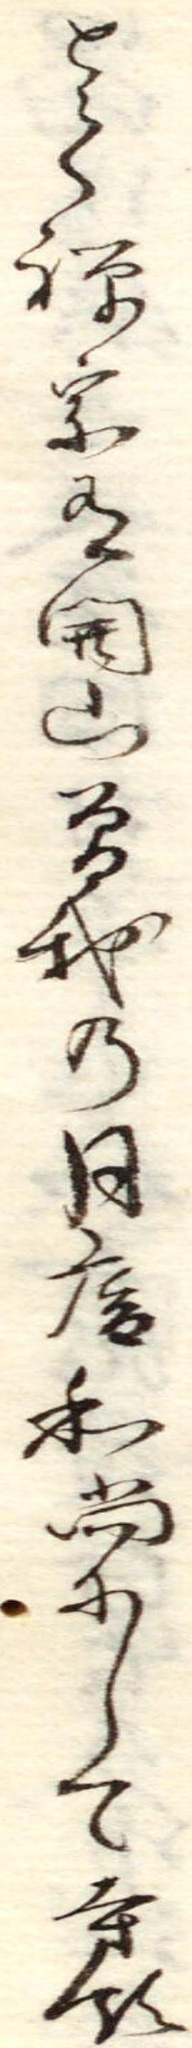とて禅宗有開山曽我の月庵和尚にして寺領
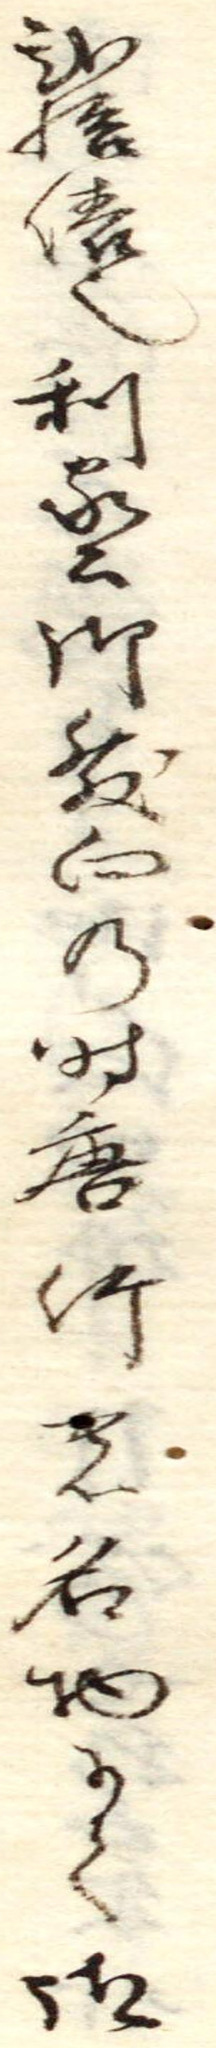弐拾俵也利家公御発向の時唐竹の名物にて御
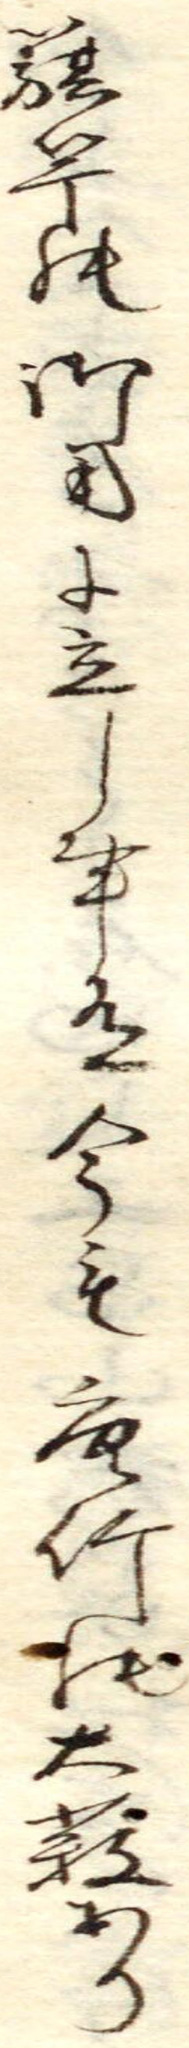旗竿の御用に立し事有今も唐竹の大薮あり
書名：能登名跡誌
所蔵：Ishikawa Prefectural Library
